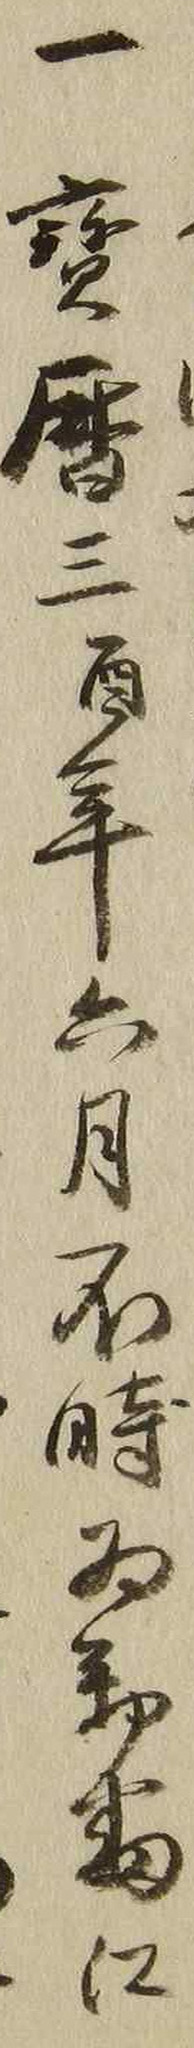一宝暦三酉年六月不時為勤番江
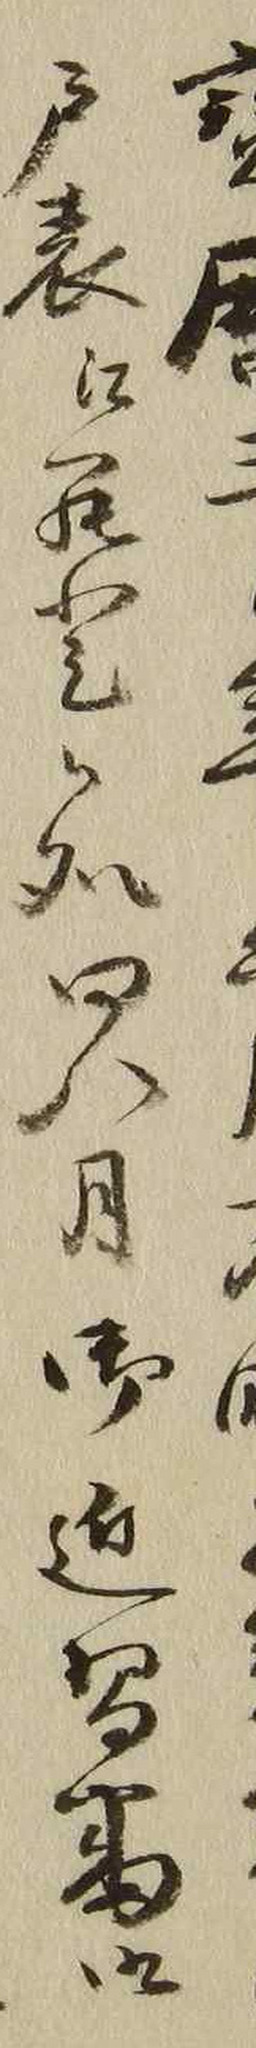戸表江罷登候処同八月御近習番御
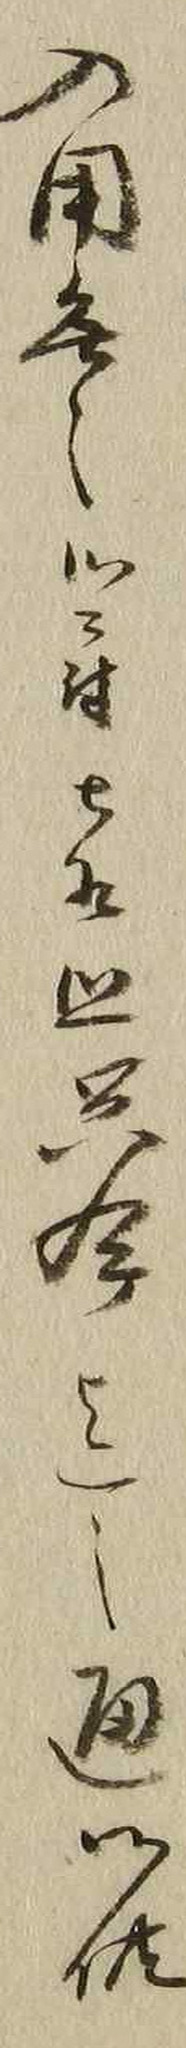入用無之候ニ付被相但只今迄之通御供
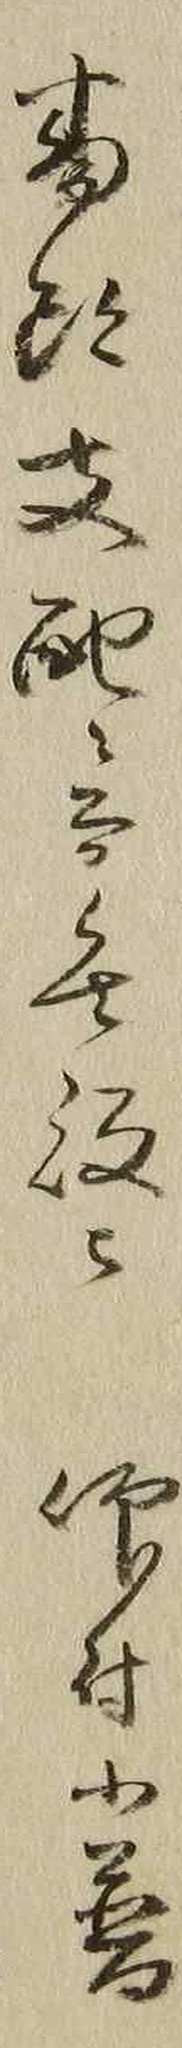番頭支配ニ而無役被仰付小普
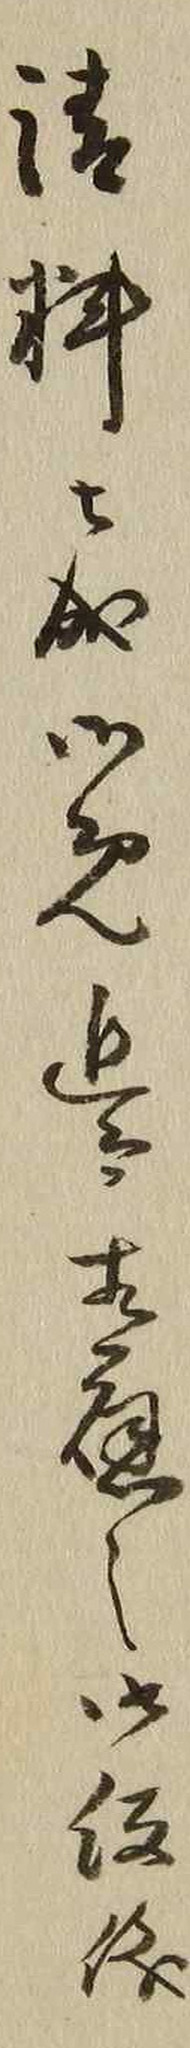請料被成御免追而相応之御仮儀
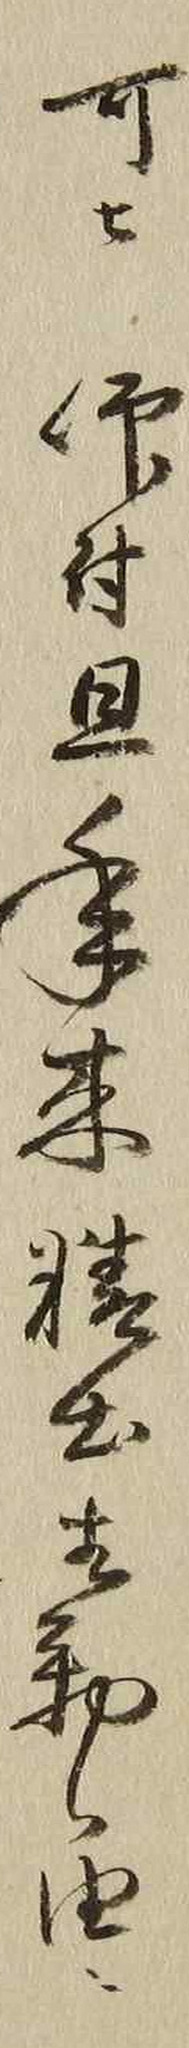可被仰付且年来精出相勤候由ニ
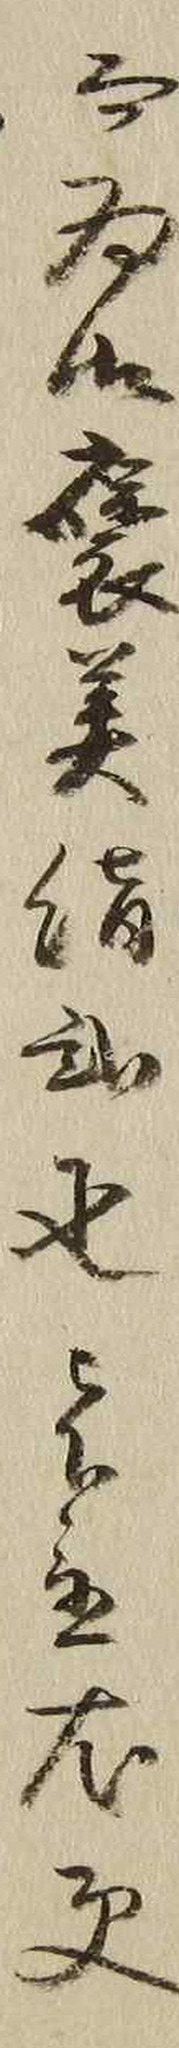而為御褒美絹弐疋被下置尤更
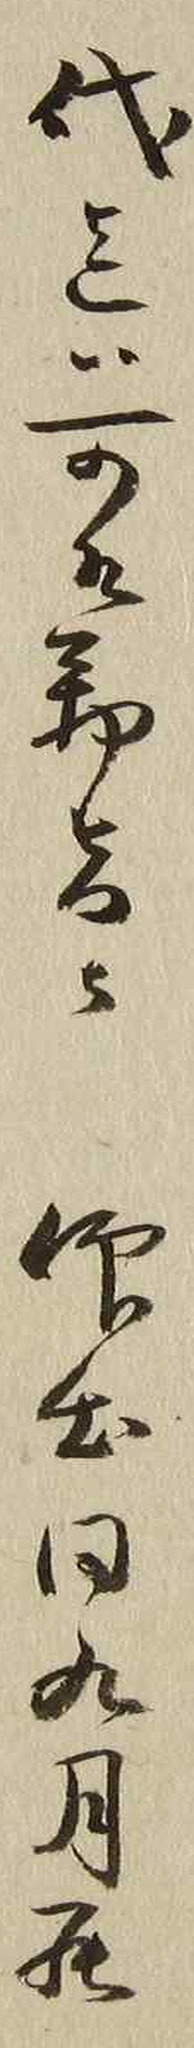代迄ハ可相勤旨被仰出同九月罷
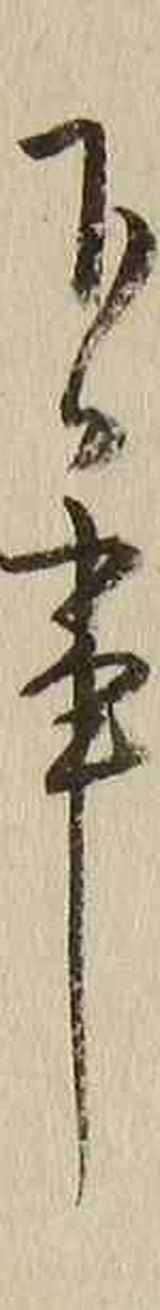下候事
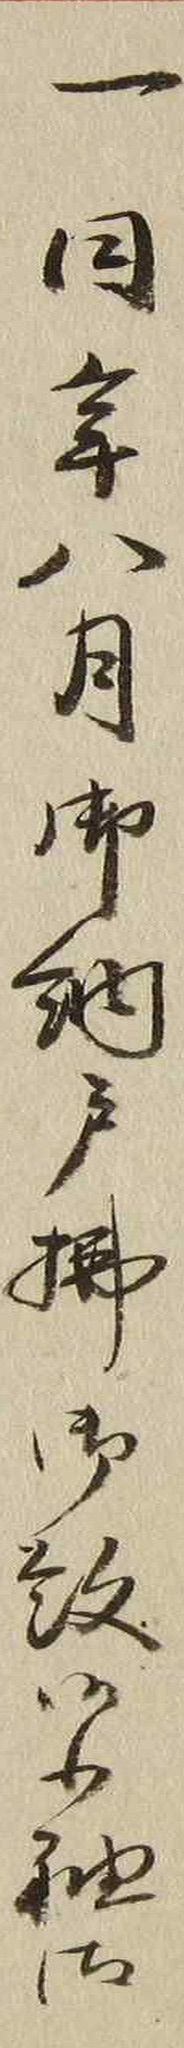一同年八月御納戸払御紋御小袖御
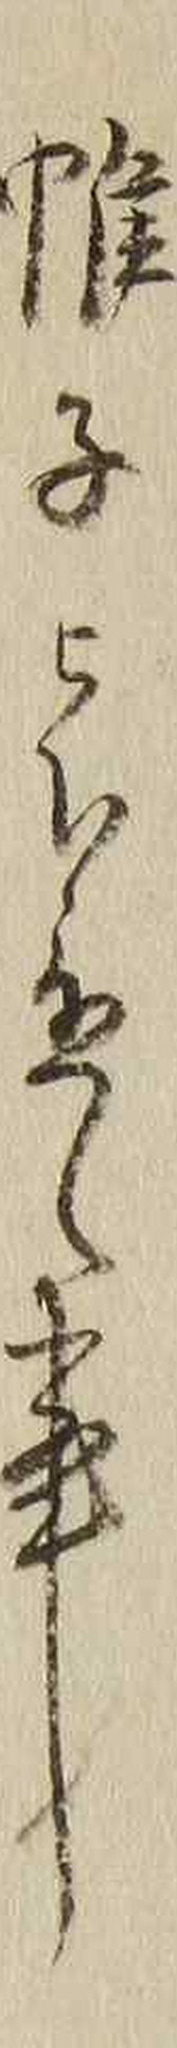帷子被下置候事
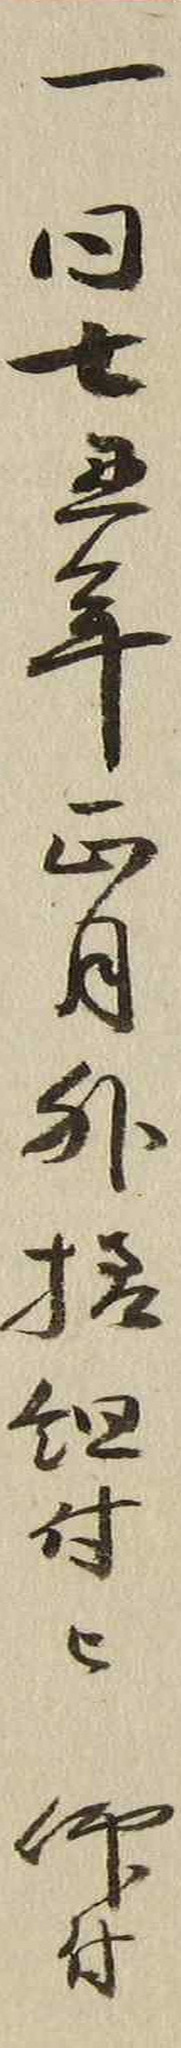一同七丑年正月外様組付被仰付
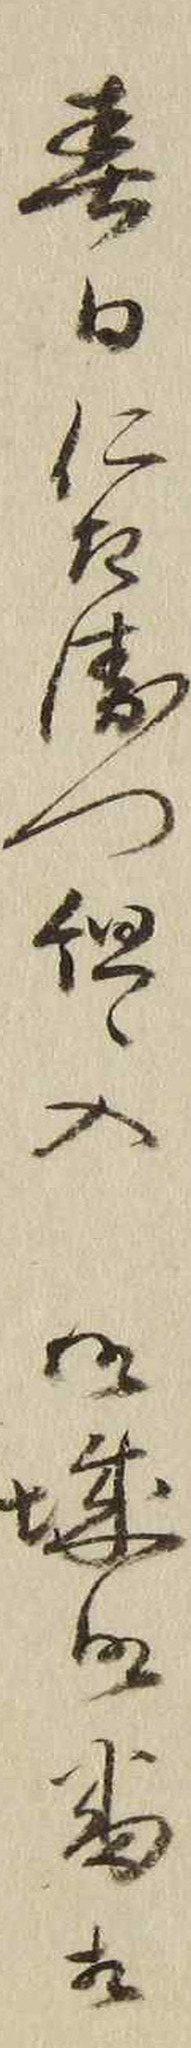春日仁左衛門組へ入御城御番相
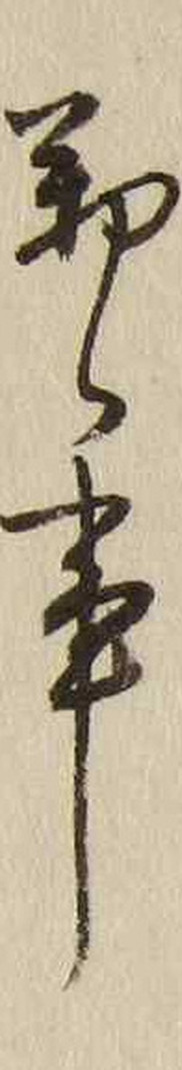勤候事
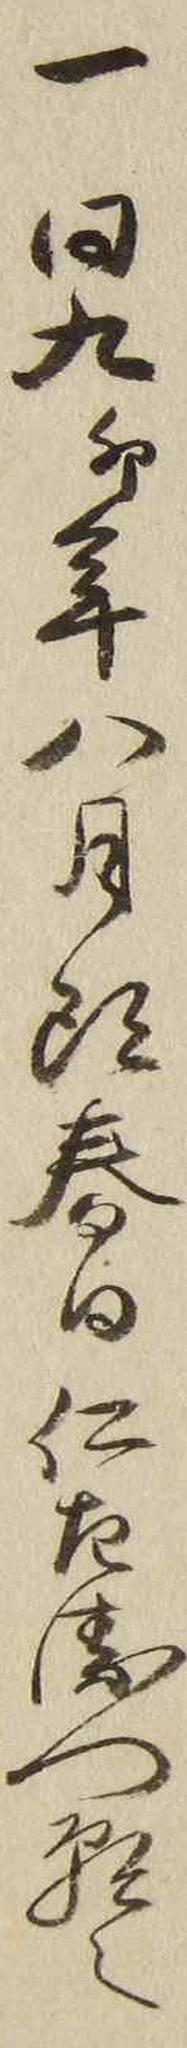一同九卯年八月頭春日仁左衛門願之

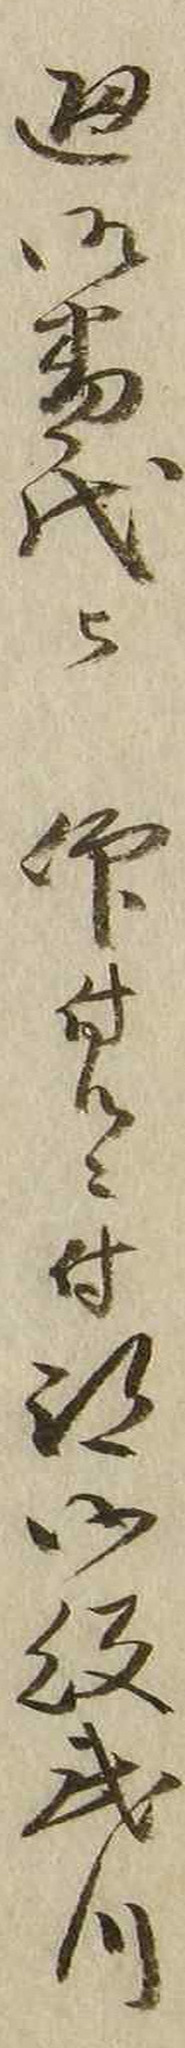通御番代被仰付候ニ付跡御役武川
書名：諸士系譜　巻之236　ふ之部4
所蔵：会津若松市立会津図書館
